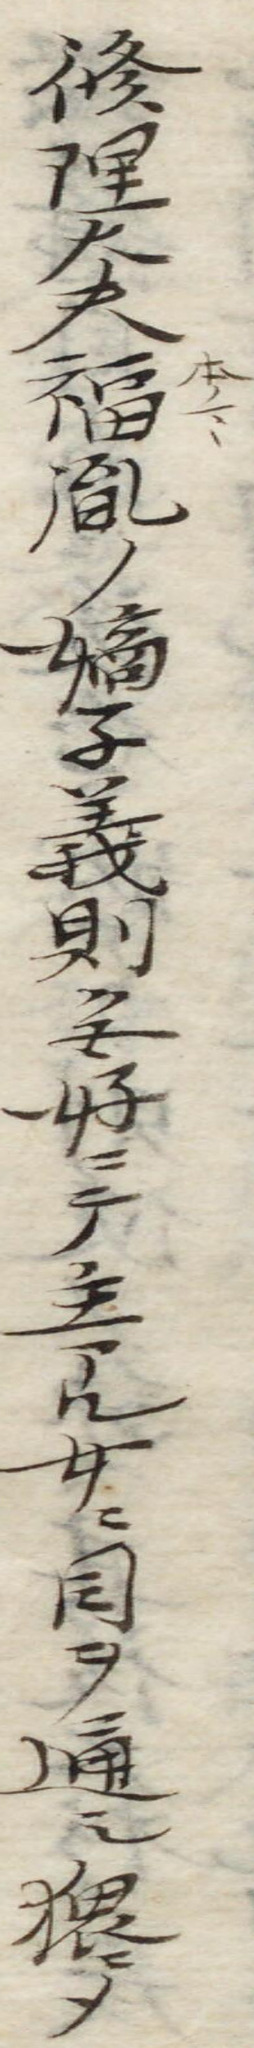修理大夫福胤ノ嫡子義則妄好二テ主アル女ニ目ヲ通シ猥ニメ
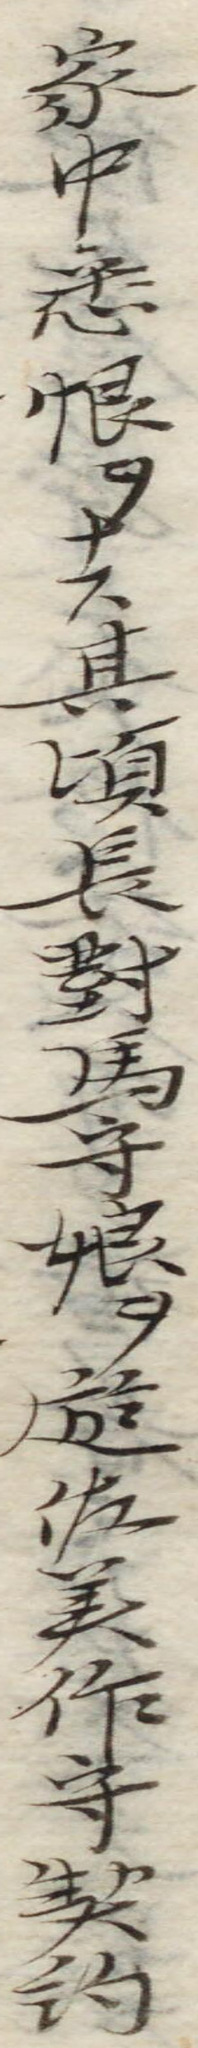家中悉恨ヲナス其頃長對馬守娘ヲ遊佐美作守契約
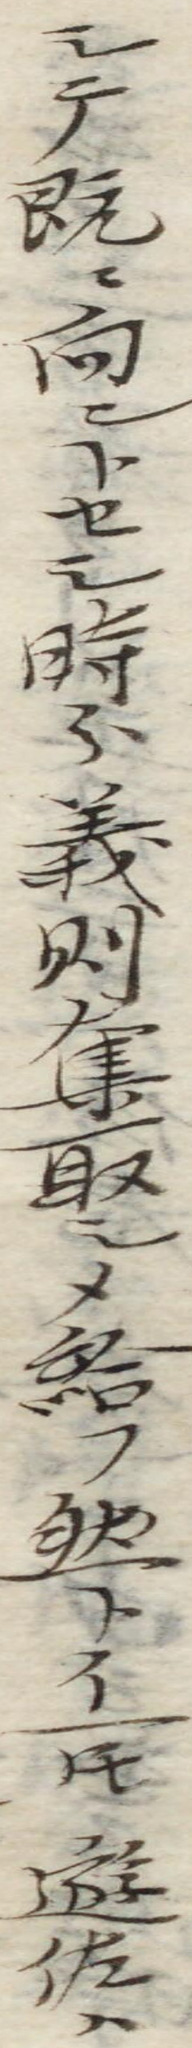シテ既ニ向ントセシ時分義則奪取シメ給フ然トイヘトモ遊佐ハ
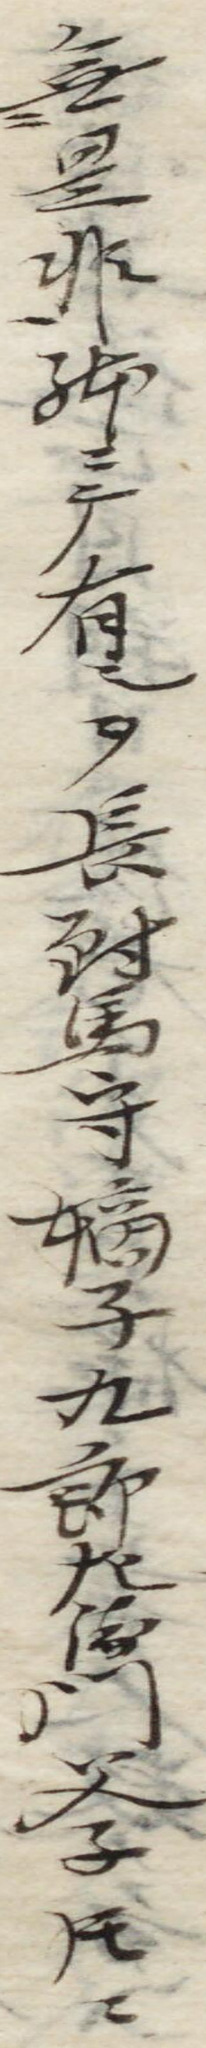無是非躰二テ有シヲ長對馬守嫡子九郎左衛門父子トモニ
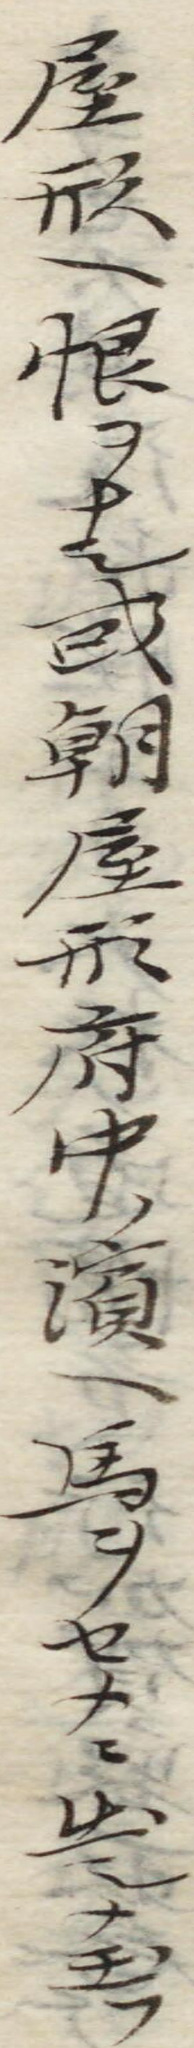屋形へ恨ヲナシ或朝屋形府中ノ浜へ馬ヲセメニ出シメ玉フ
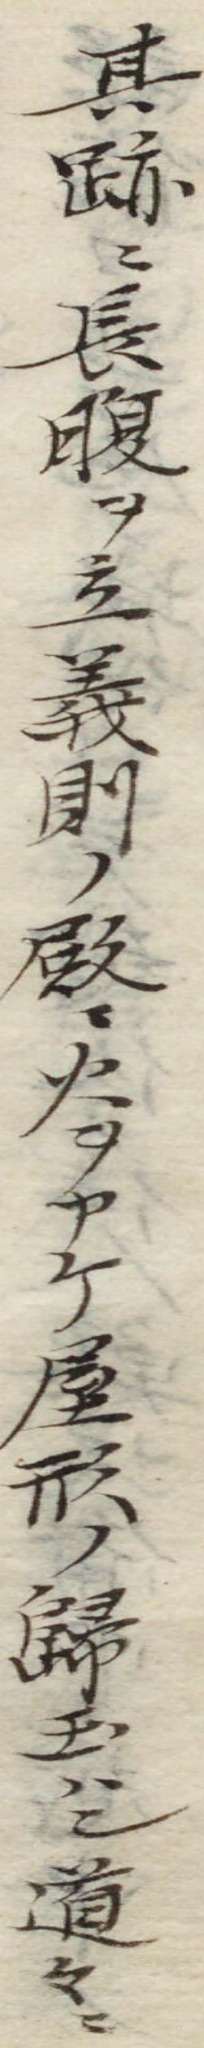其跡ニ長腹ヲ立義則ノ殿ニ火ヲカケ屋形ノ帰玉ハン道々ニ
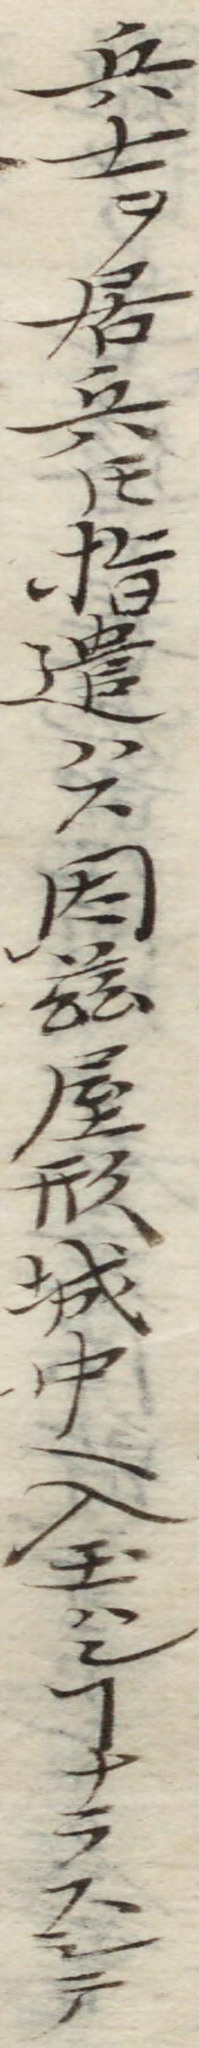兵士ヲ居兵トモ指遣ハス因茲屋形城中へ入玉ハン事ナラスシテ
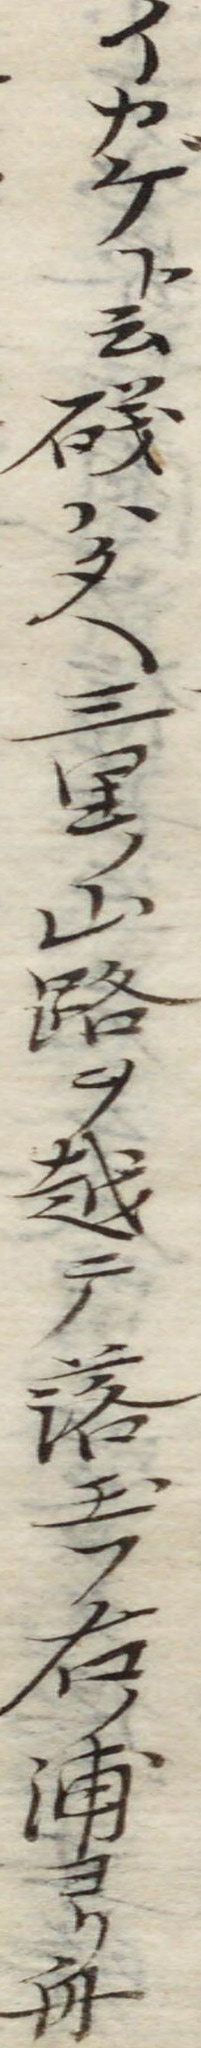イゲト云磯ハタヘ三里ノ山路ヲ越テ落玉フ右ノ浦ヨリ舟
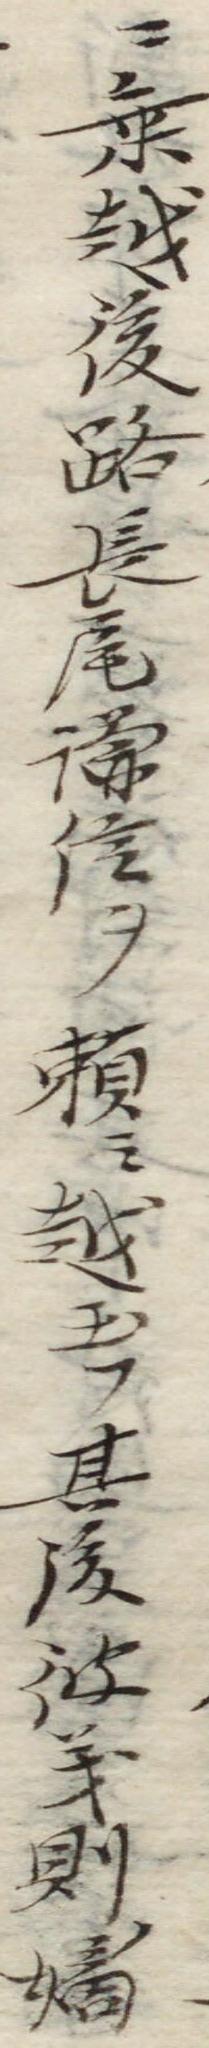ニ乗越後路長尾謙信ヲ頼ミ越玉フ其後彼義則ノ嫡男
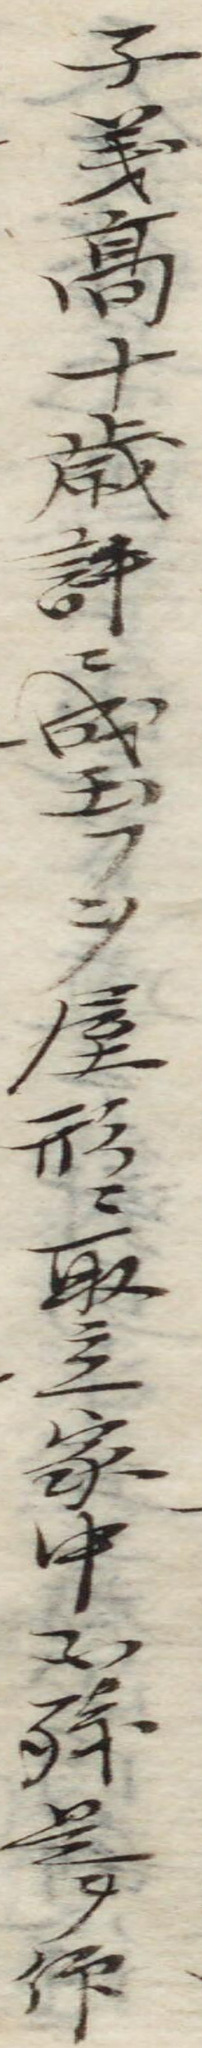子義高十歳計ニ成玉フヲ屋形ニ取立家中不残是ヲ仰
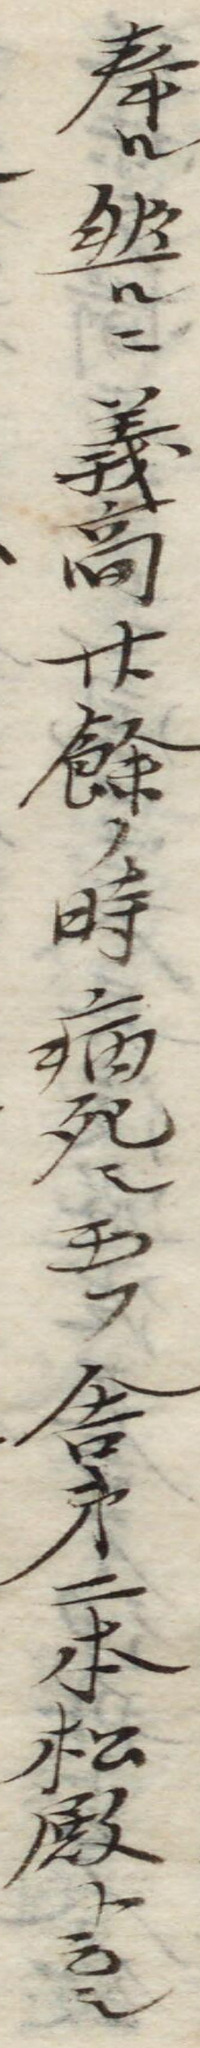奉ル然ルニ義高廿余ノ時病死シ玉フ舎弟二本松殿ト云シ
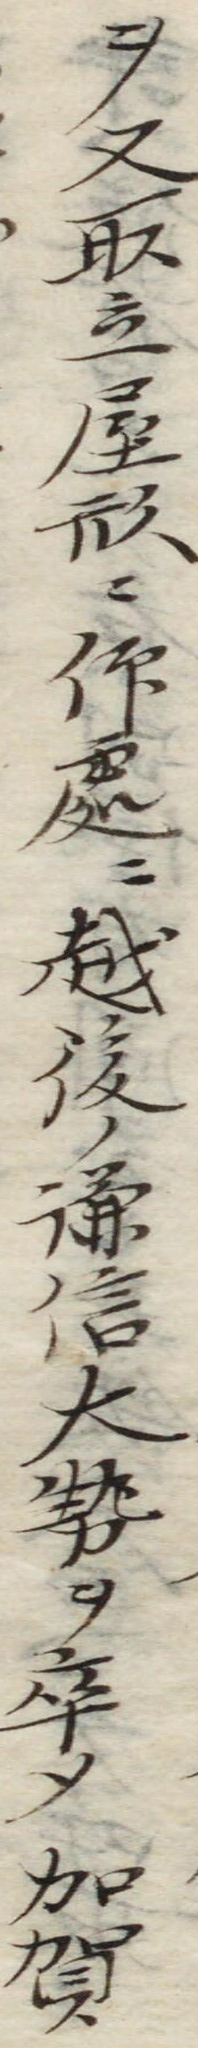ヲ又取立屋形ニ仰処ニ越後ノ謙信大勢ヲ卒メ加賀
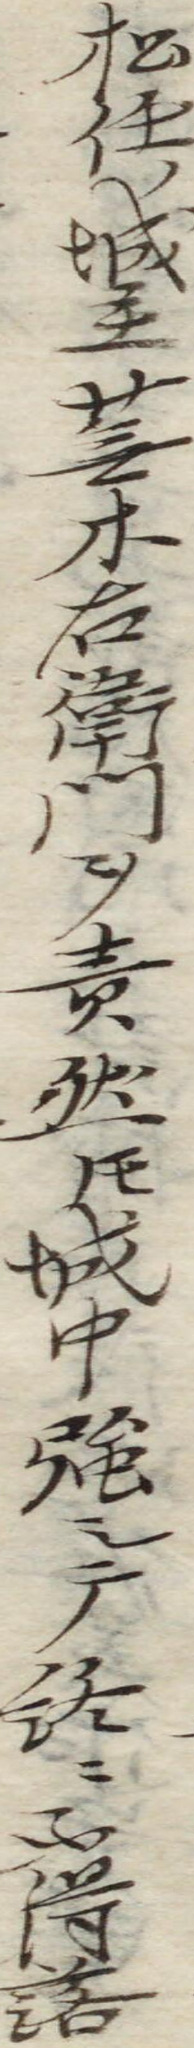松任ノ城主蕪木右衛門ヲ責然トモ城中強シテ終ニ不得落
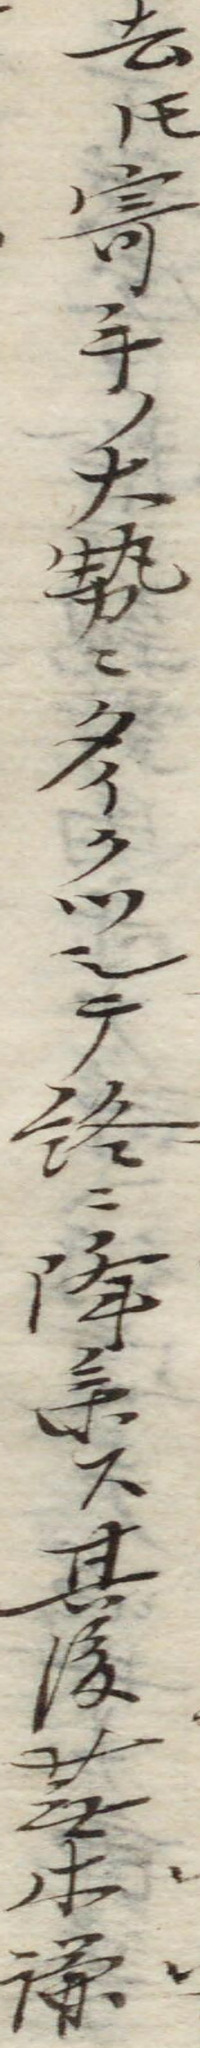去トモ寄手ノ大勢ニタイクツシテ終ニ降参ス其後蕪木謙
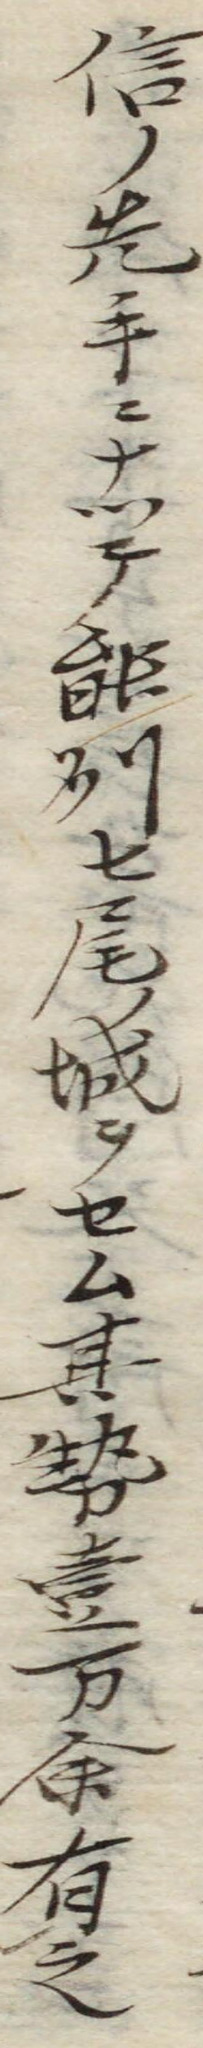信ノ先手ニナツテ能州七尾ノ城ヲセム其勢壱万余有之
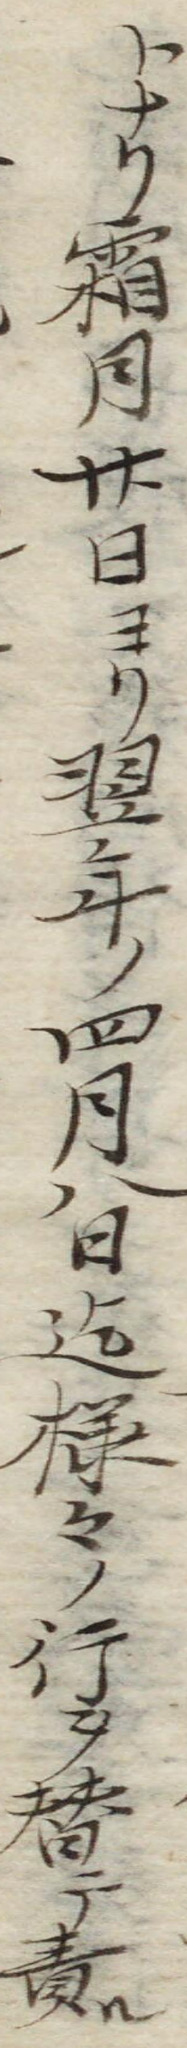トナリ霜月廿日ヨリ翌年ノ四月八日迄様々ノ行ヲ替テ責ル
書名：聞見雑録
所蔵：Ishikawa Prefectural Library
